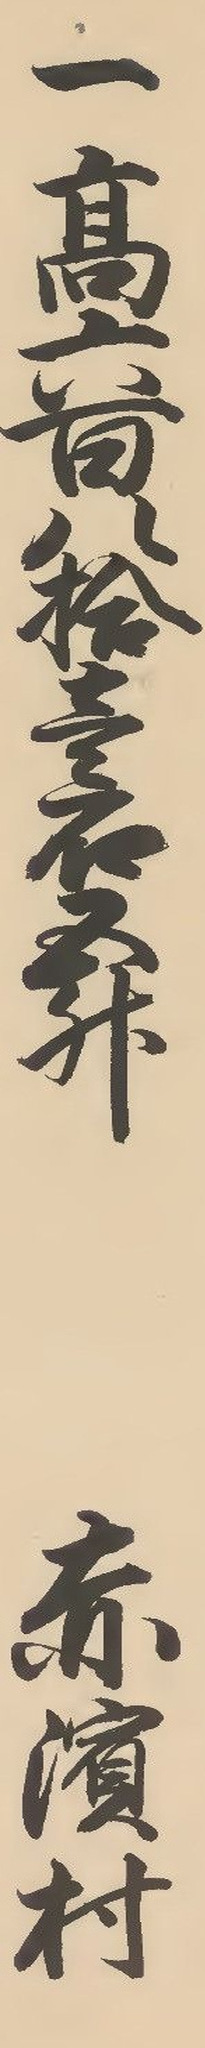一高六百八拾壱石五升赤濱村
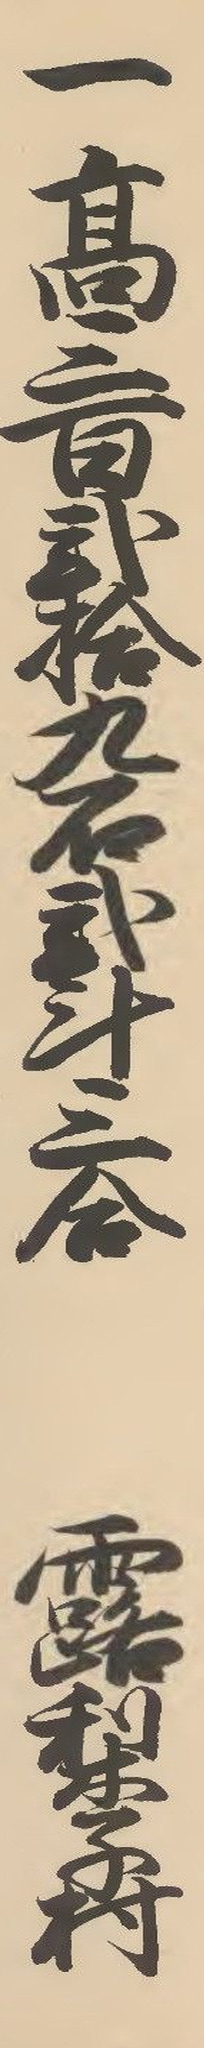一高三百弐拾九石弐斗三合露梨子村
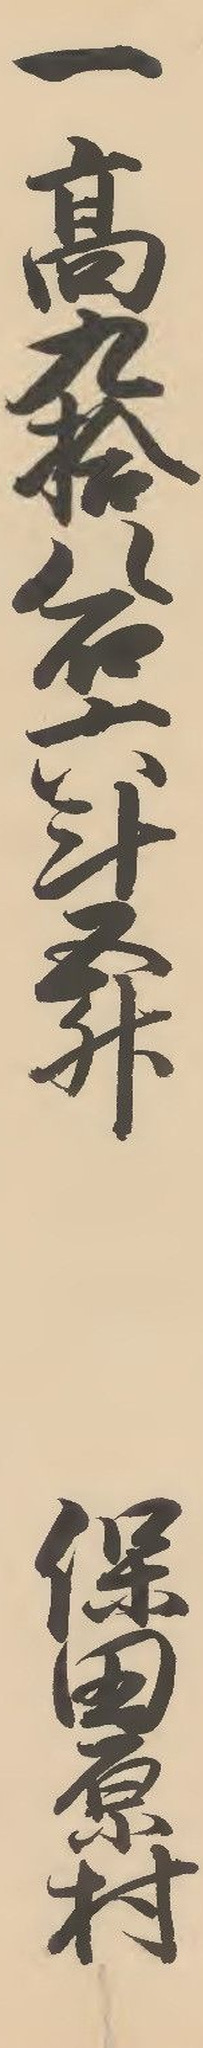一高九拾八石六斗五升保田原村
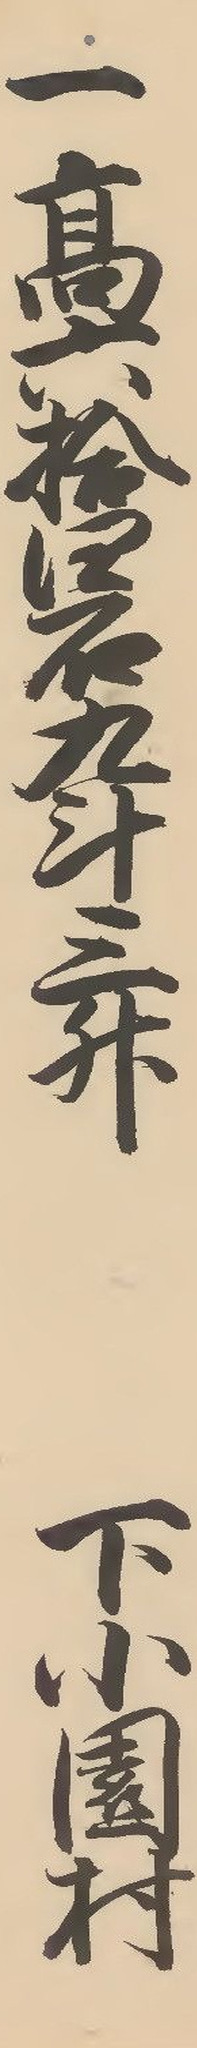一高六拾四石九斗三升下小園村
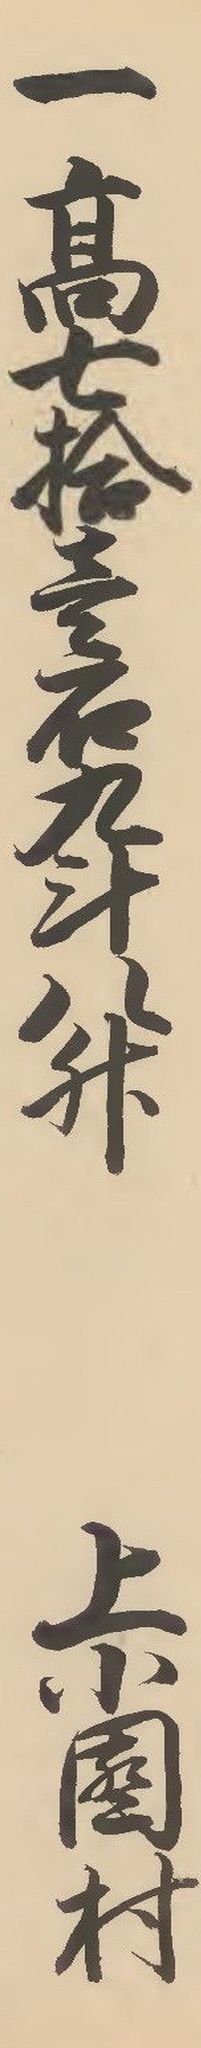一高七拾壱石九斗八升上小園村
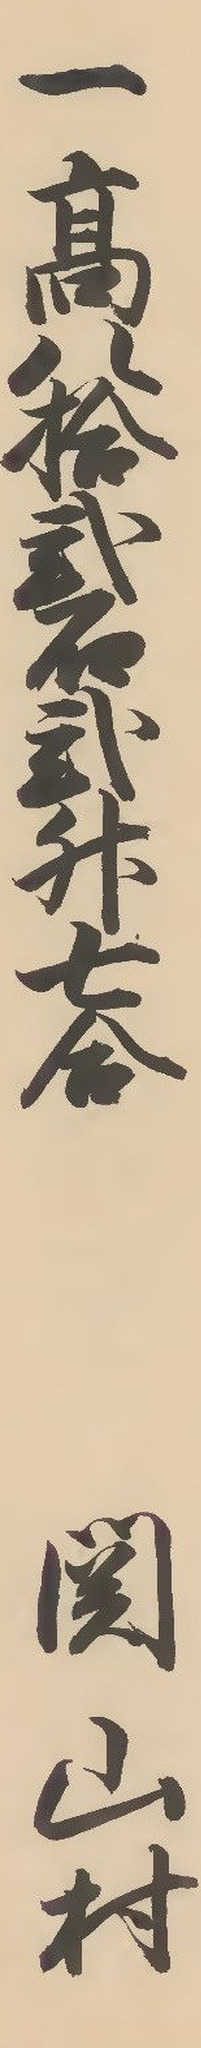一高八拾弐石弐升七合関山村

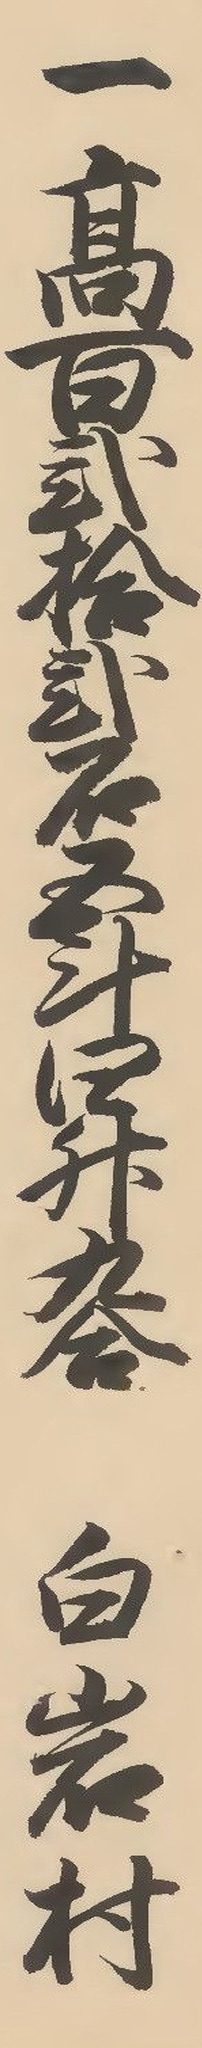一高百弐拾弐石五斗四升九合白岩村
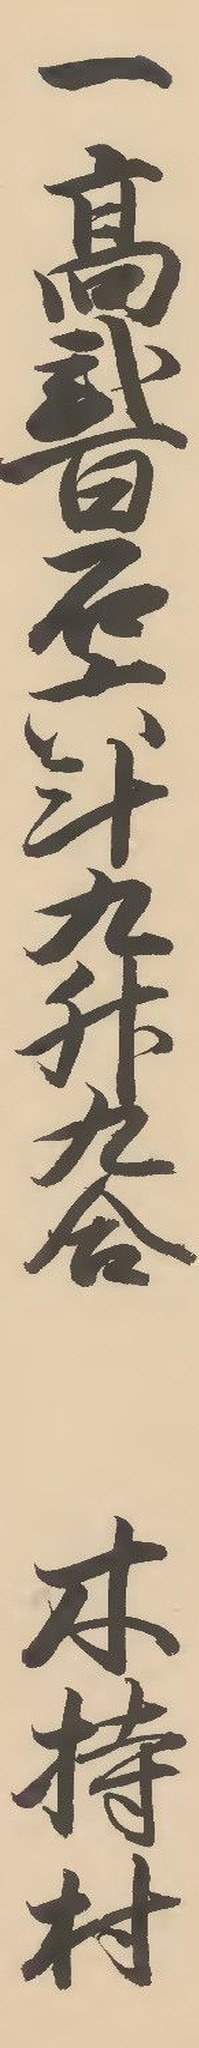一高弐百石六斗九升九合木持村
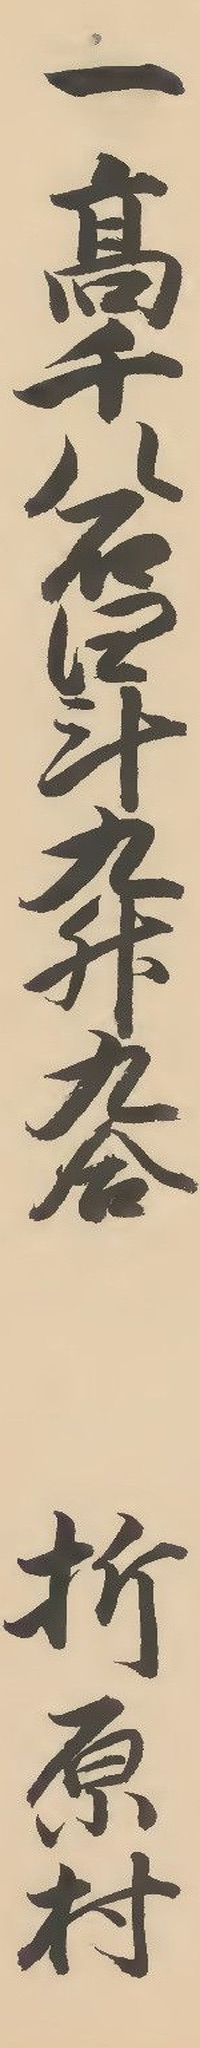一高千八石四斗九升九合折原村
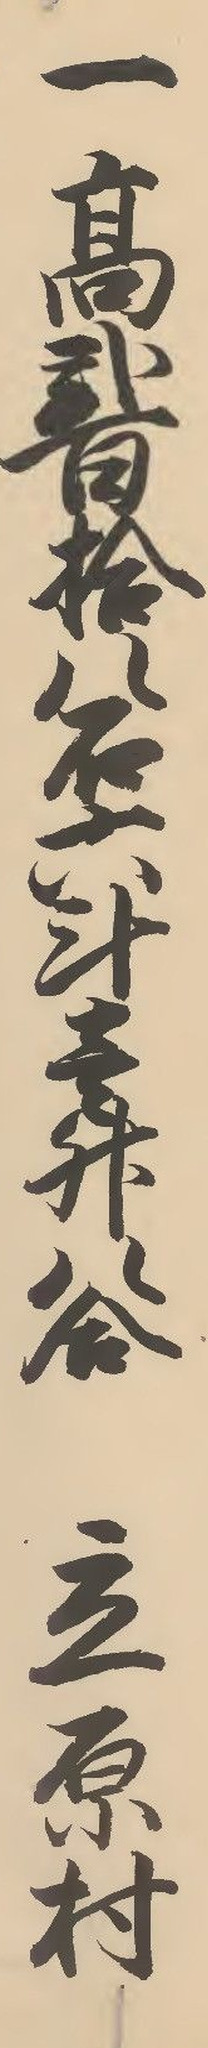一高弐百拾八石六斗壱升八合立原村
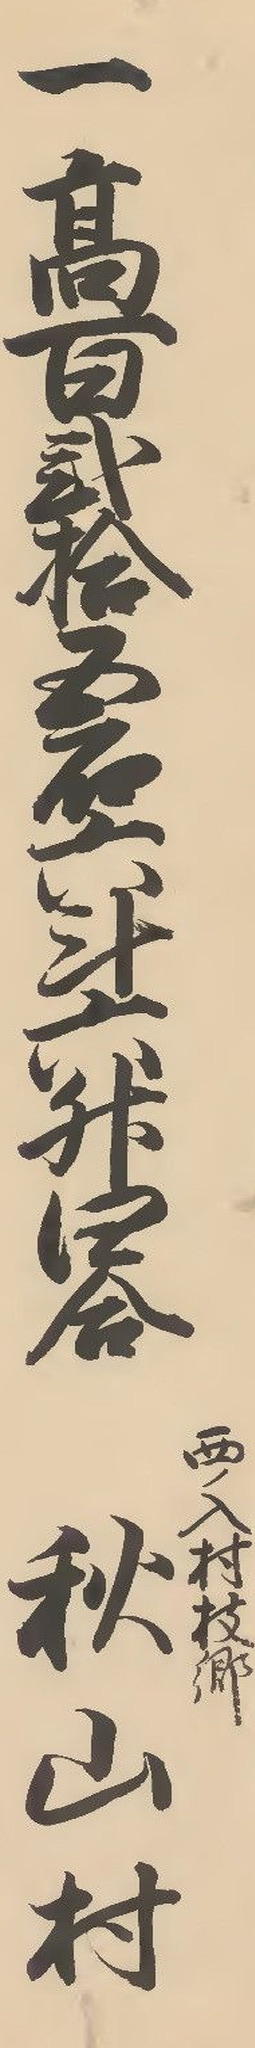一高百弐拾五石六斗六升四合秋山村
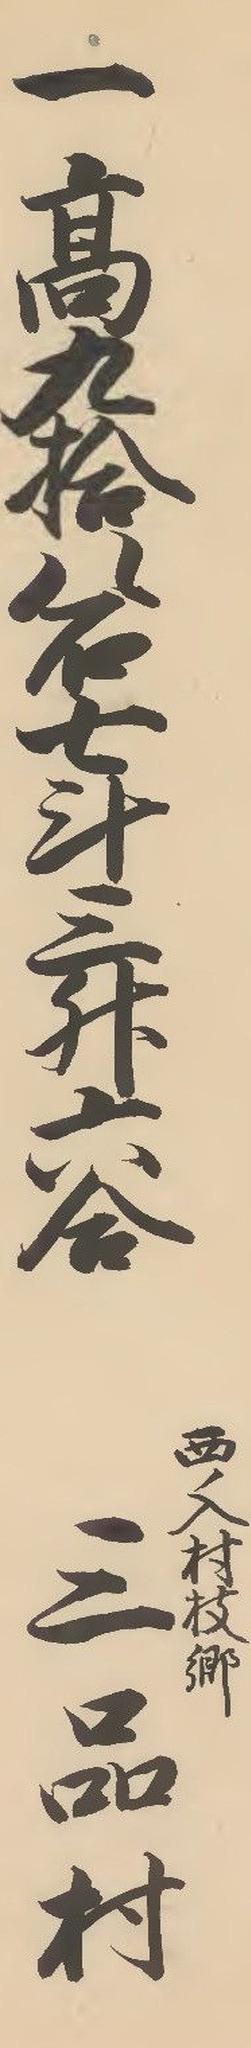一高九拾八石七斗三升六合三品村
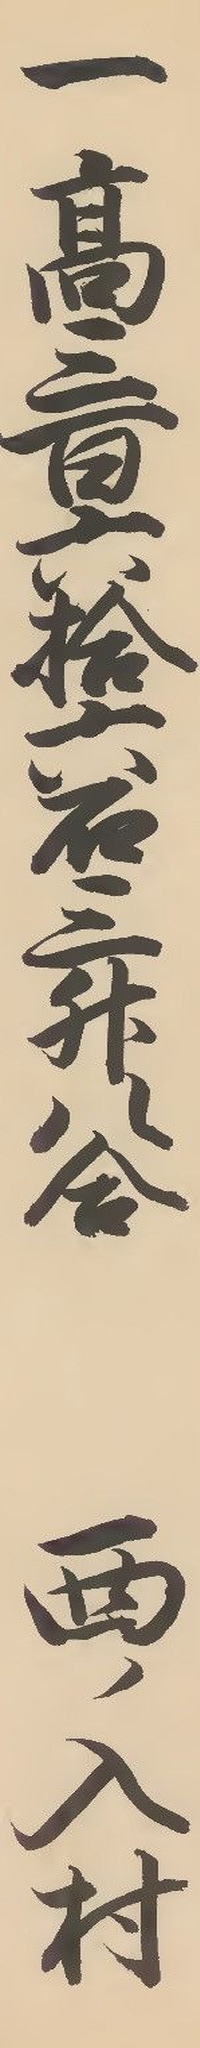一高三百六拾六石三升八合西ノ入村
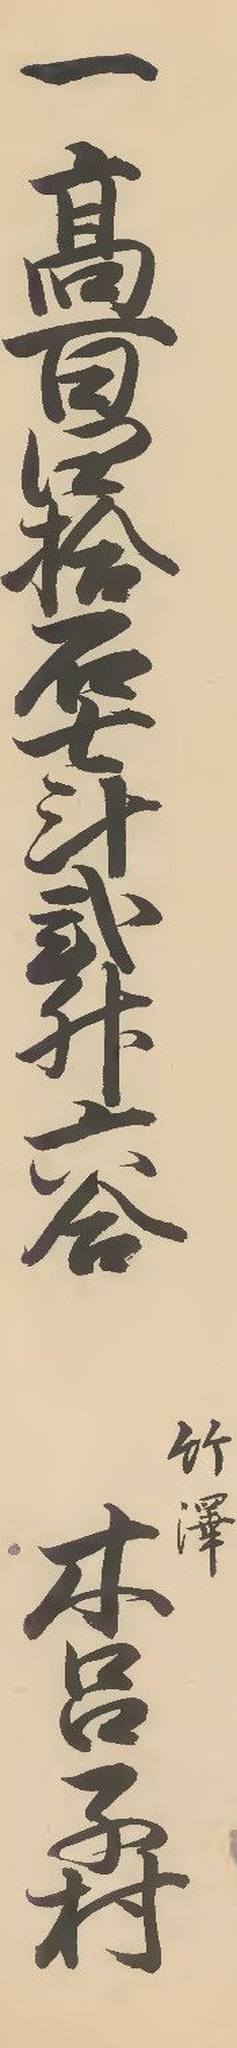一高百四拾石七斗弐升六合木呂子村

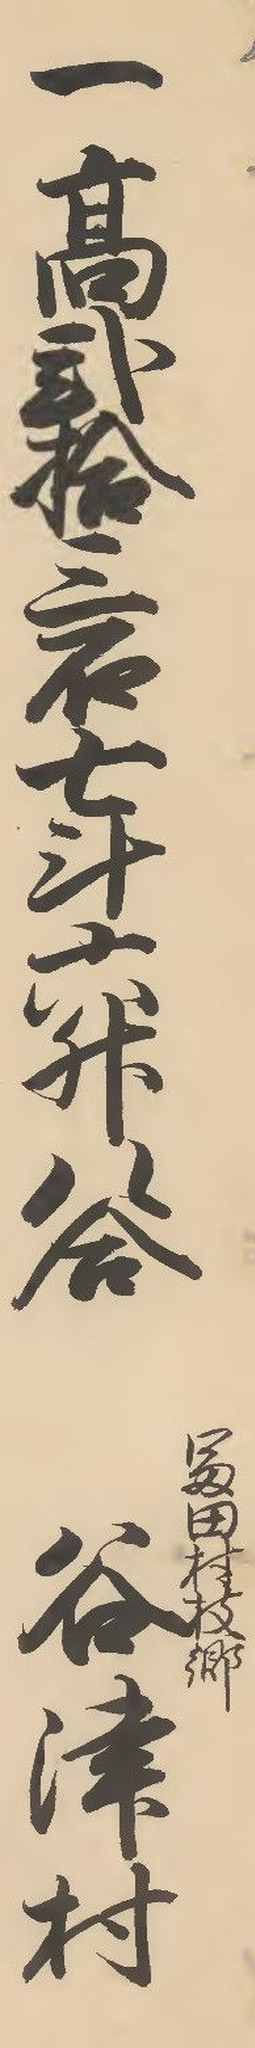一高弐拾三石七斗六升八合谷津村
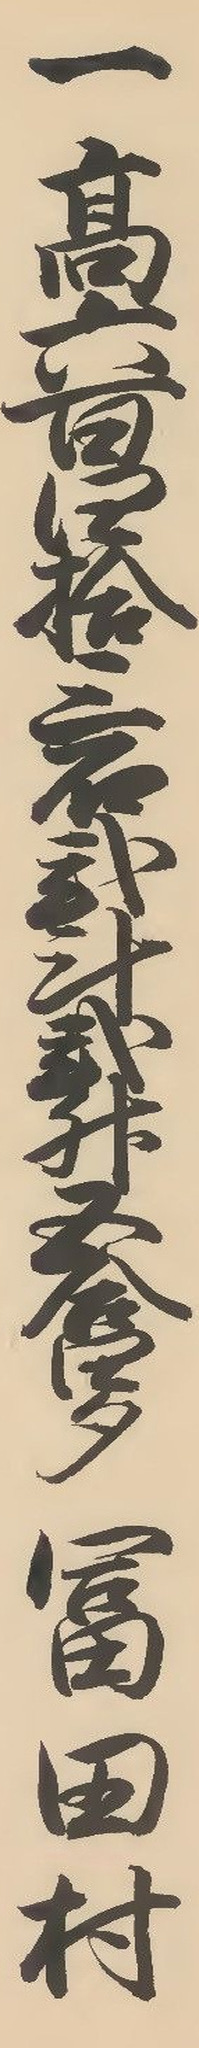一高六百四拾三石弐斗弐会五合四勺冨田村
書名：武蔵国郷帳　上
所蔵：国立公文書館 National Archives of Japan
